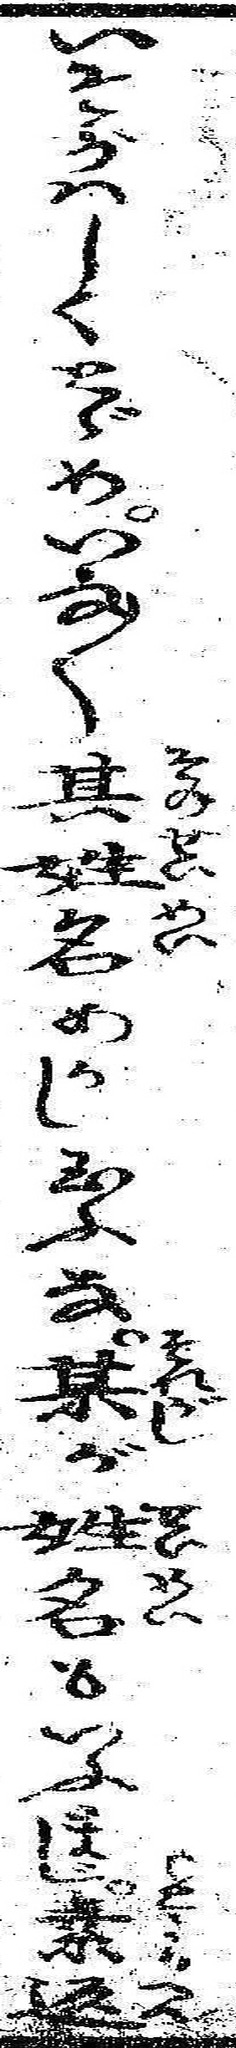いそがはしくとゞめ。いな〳〵其姓名あかし玉ふな。某が姓名もいふまじ。素返
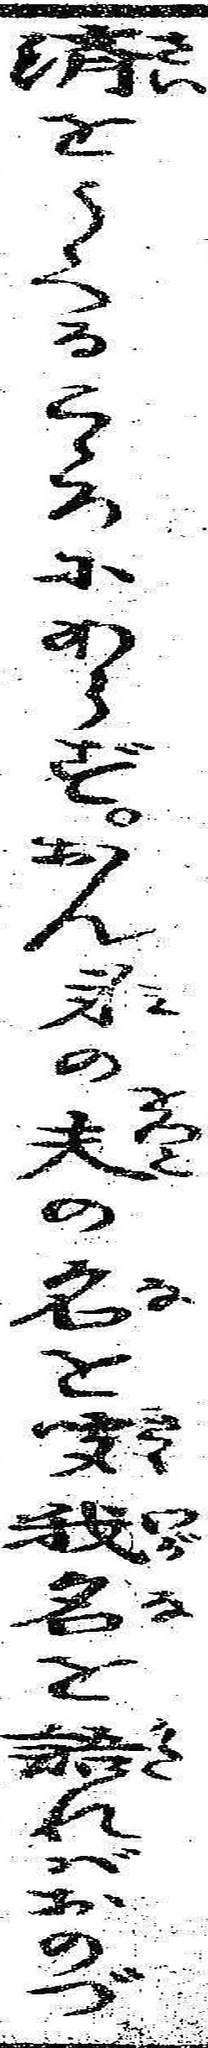済をうくるこゝろにあらず。おん身の夫の名を聞我名を語ればおのづ

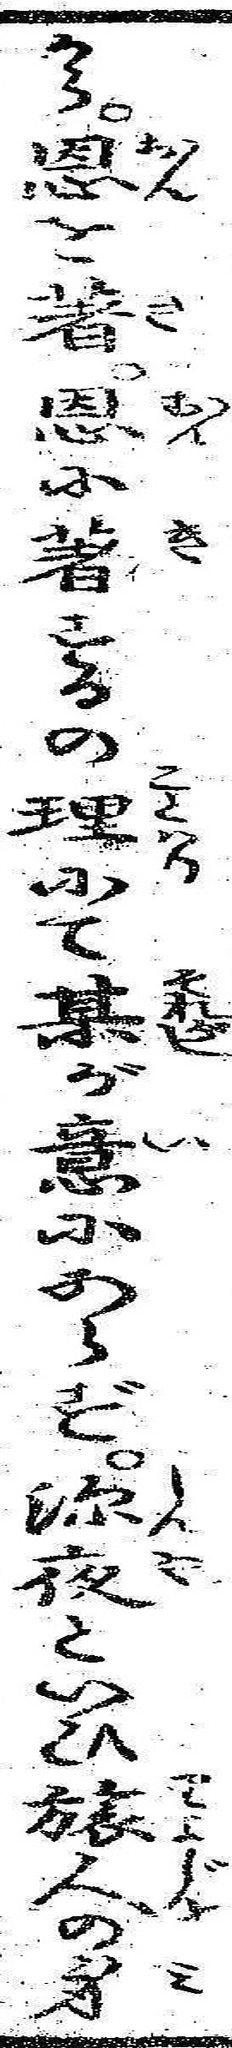から。恩を著。恩に著するの理にて某が意にあらず。深夜といひ旅人の身
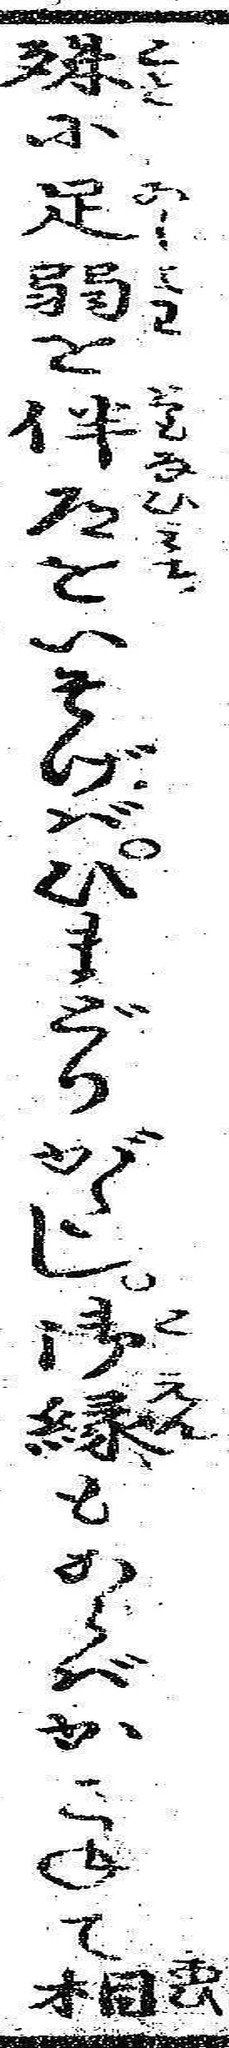殊に足弱を伴道をいそげば。ひまどりがたし。御縁もあらばかさねて相
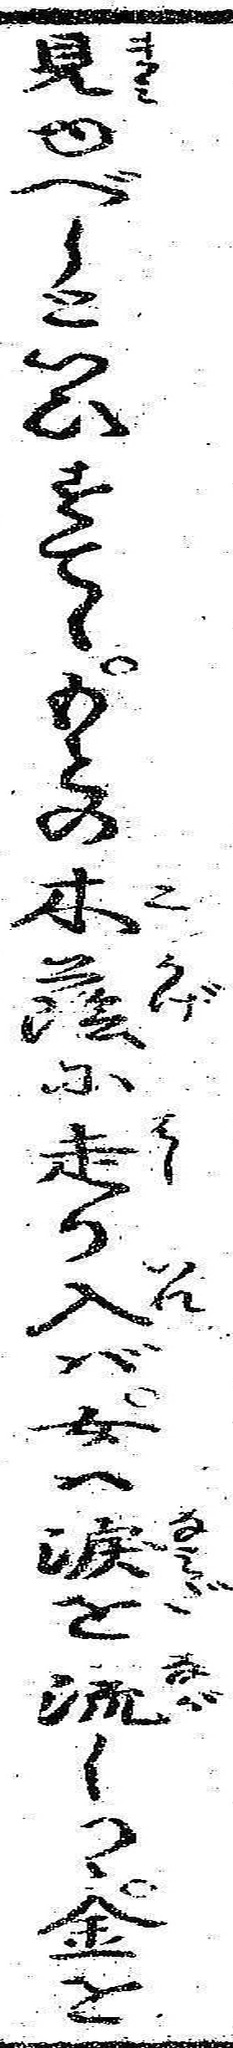見ゆべしといひすてゝ。もとの木蔭に走り入ば。女は涙を流しつゝ。金を
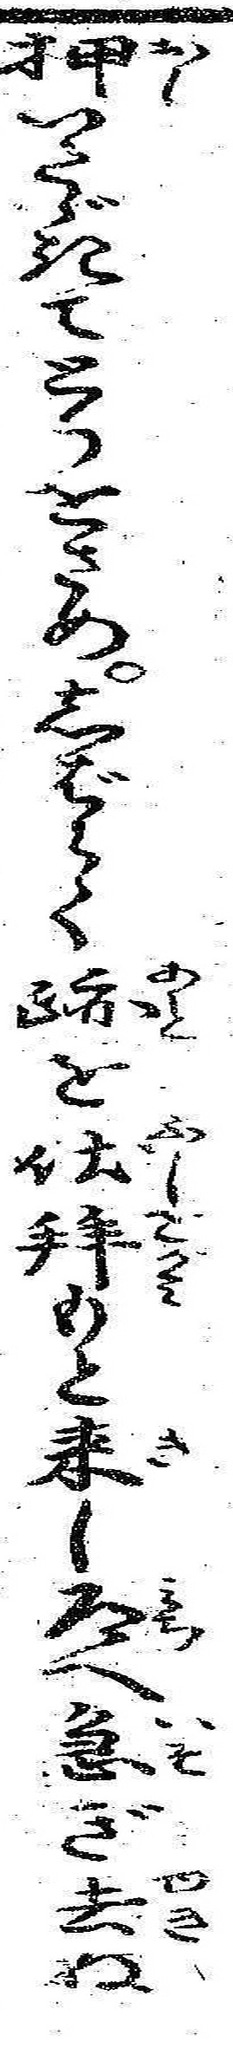押いたゞきてとりをさめ。しばらく跡を伏拝もと来し道へ急ぎ去ぬ
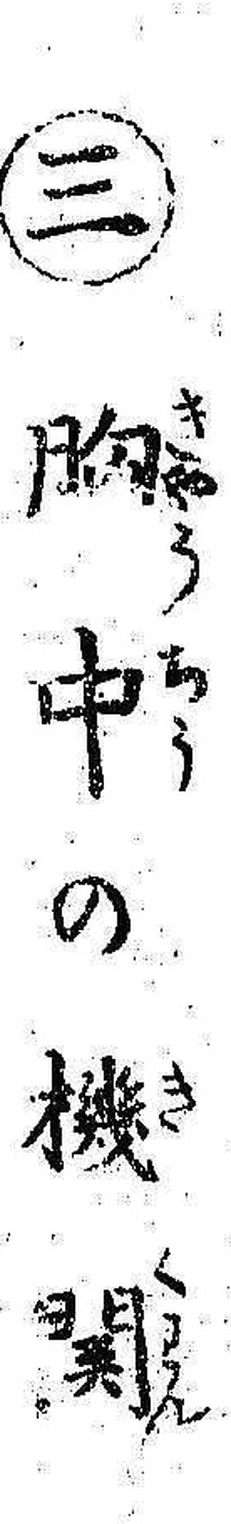三胸中の機関
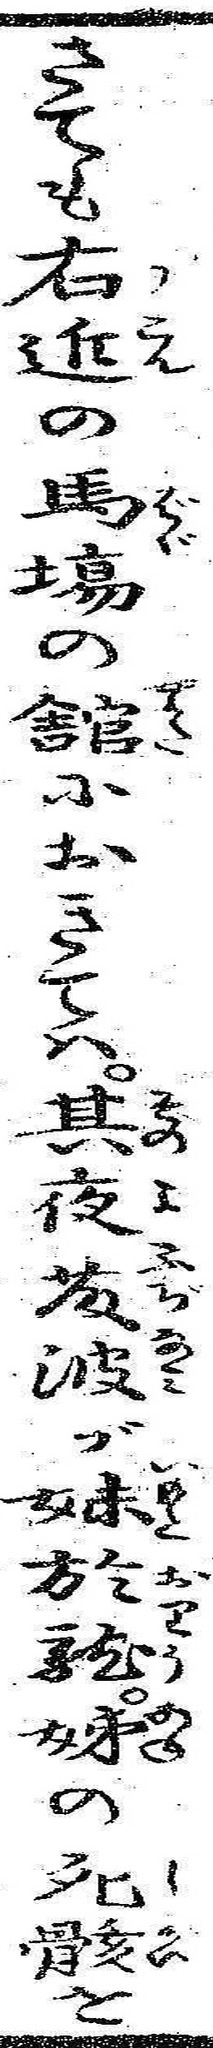さても右近の馬場の館におきては。其夜藤波が妹於竜。姉の死骸を
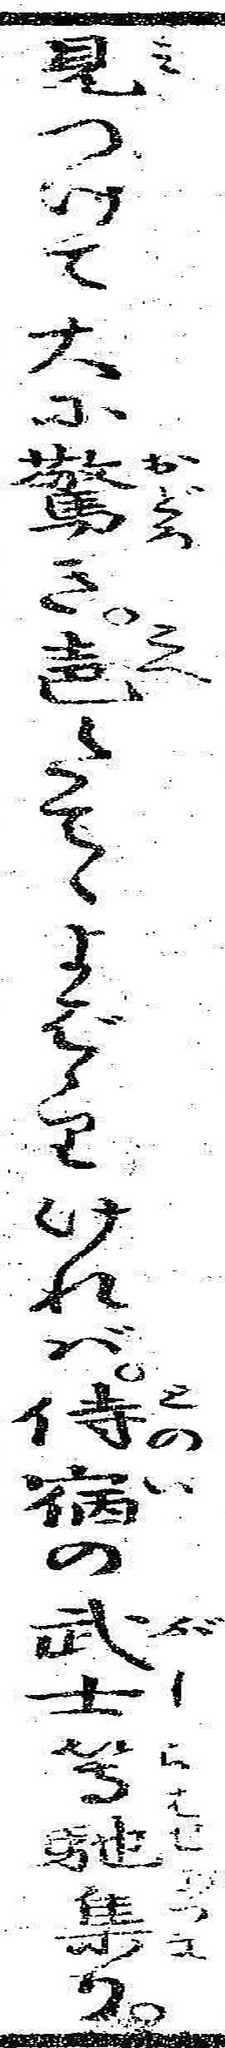見つけて大に驚き。声たてゝよばゝりければ。侍宿の武士等馳集り。
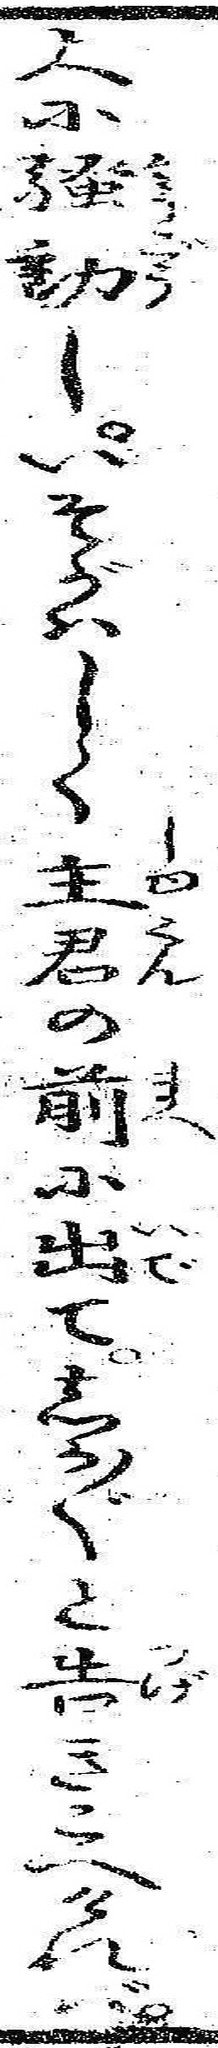大に騒動し。いそがはしく主君の前に出て。しか〴〵と告きこへければ。
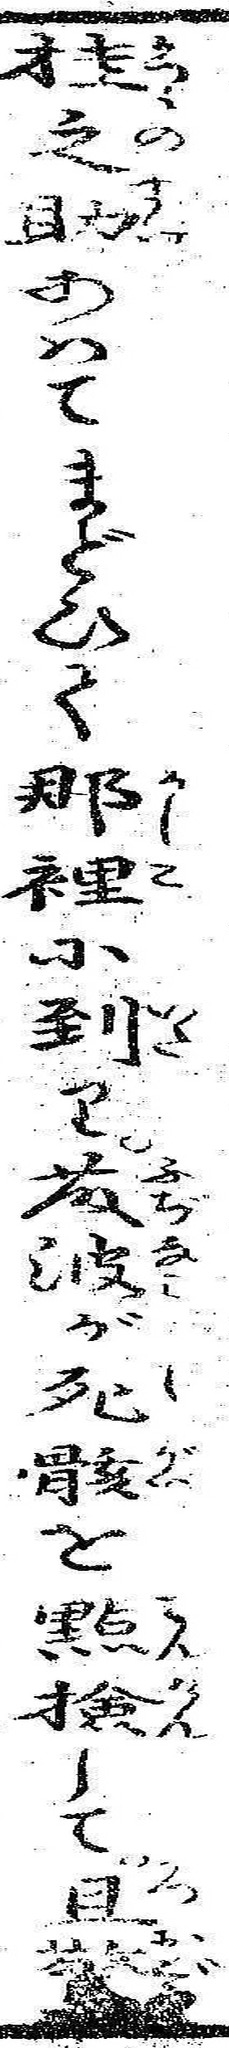桂之助あはてまどひて那裏に到り。藤波が死骸を点検して。且驚
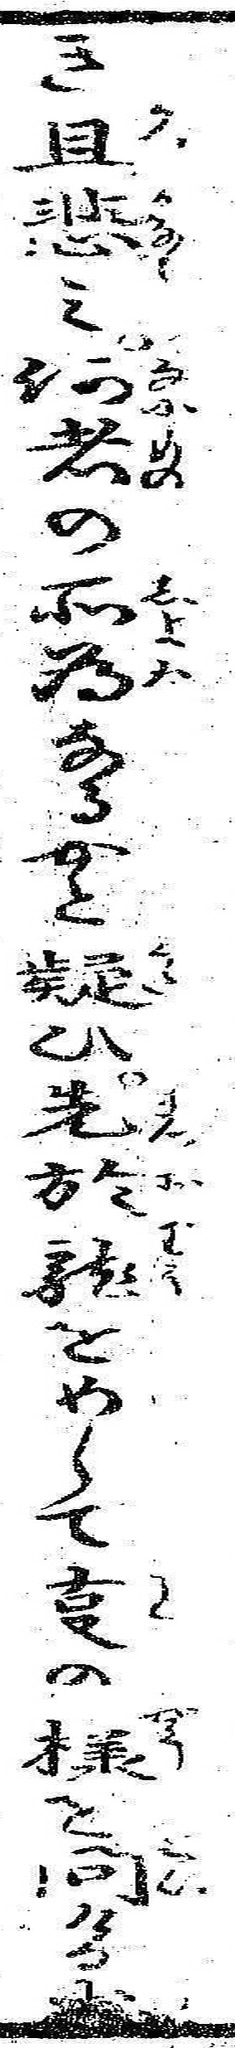き且悲み。何者の所為なるやと疑ひ。先於竜をめして事の様を問けるに
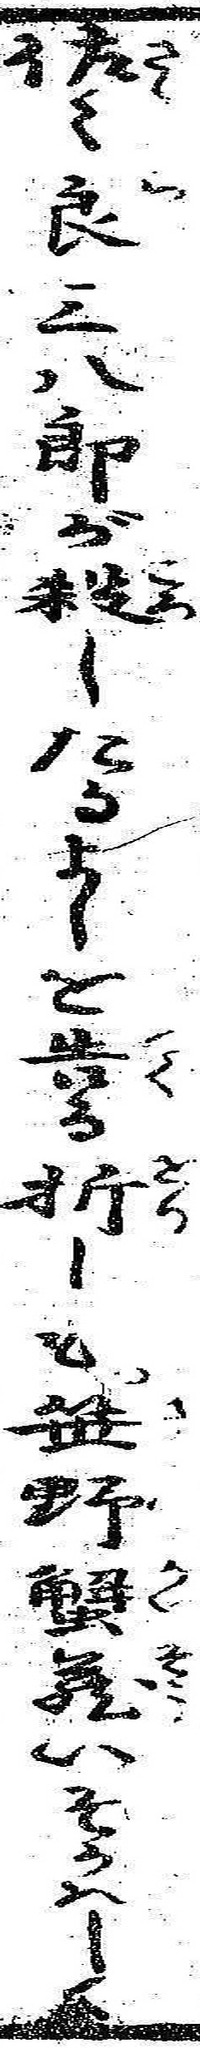佐々良三八郎が殺したるよしを告る折しも。笹野蟹蔵いそかはしく
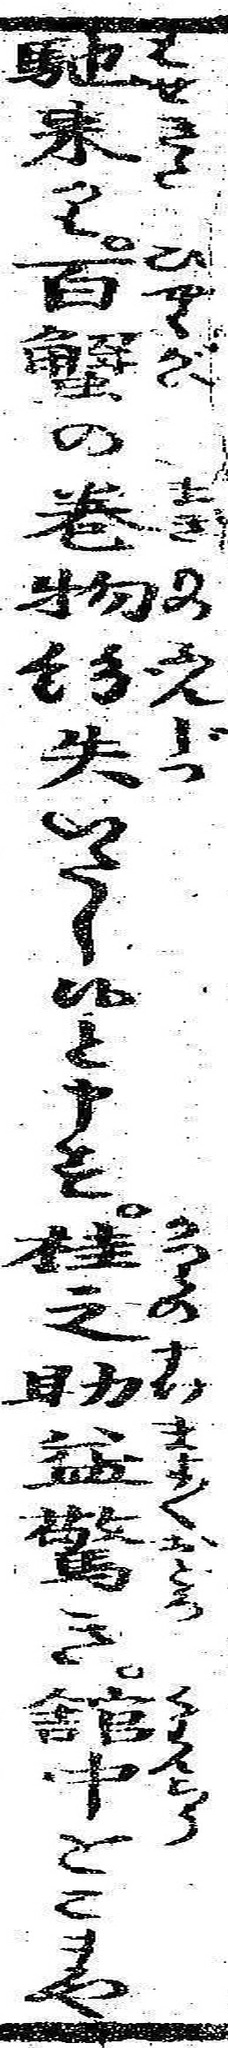馳来り。百蟹の巻物紛失いたし候と申す。桂之助益驚き。館中をこまや
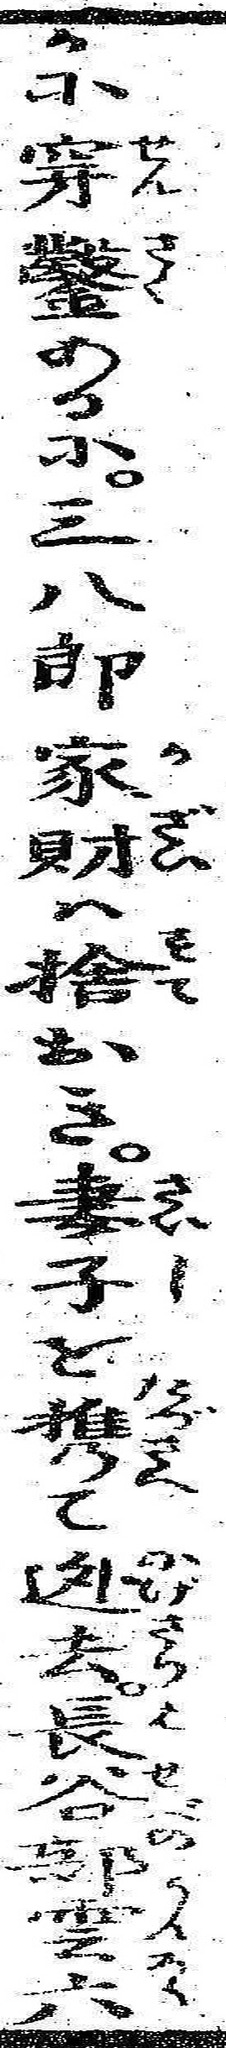かに穿鑿あるに。三八郎家財は捨おき。妻子を携て逃去。長谷部雲六
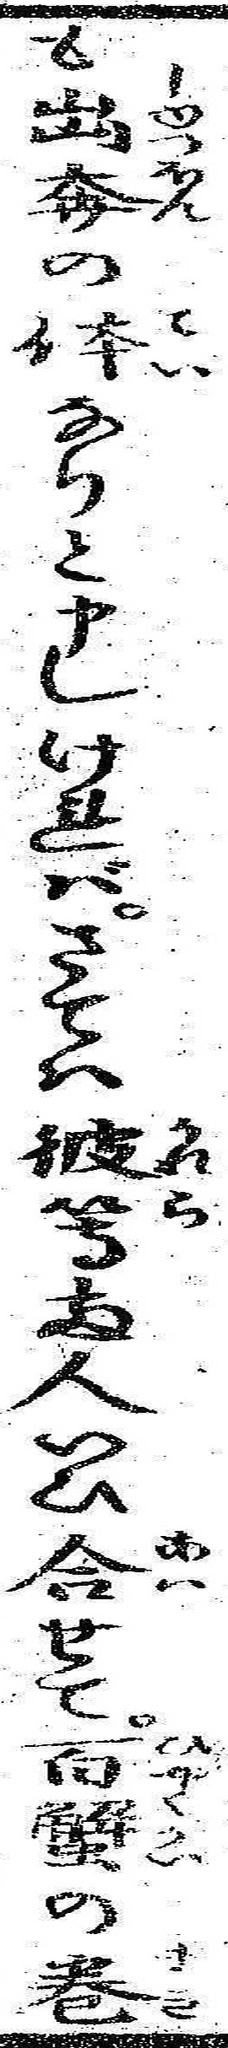も出奔の体なりと申しけれ。ばさては彼等両人いひ合せて。百蟹の巻
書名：昔話稲妻表紙
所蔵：国文学研究資料館
